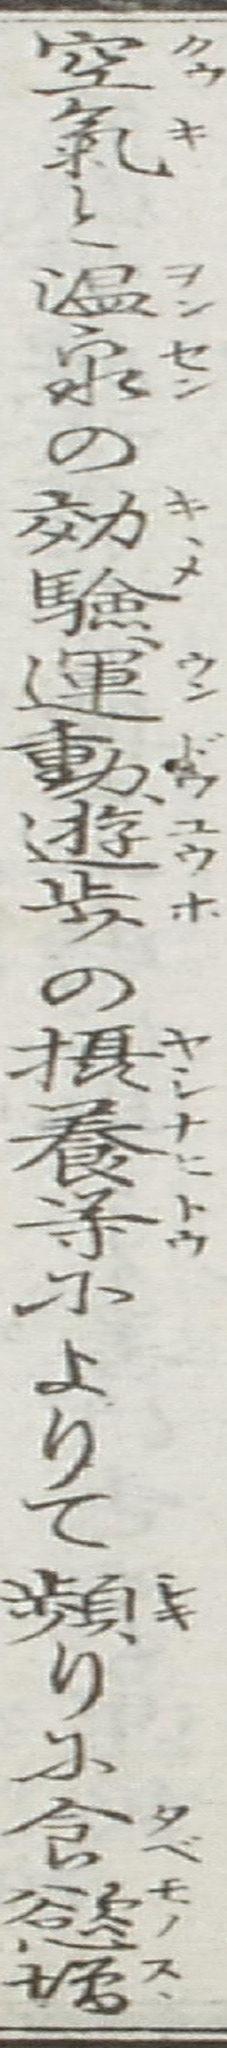空気と温泉の効験、運動、游歩の摂養等によりて頻りに食慾増
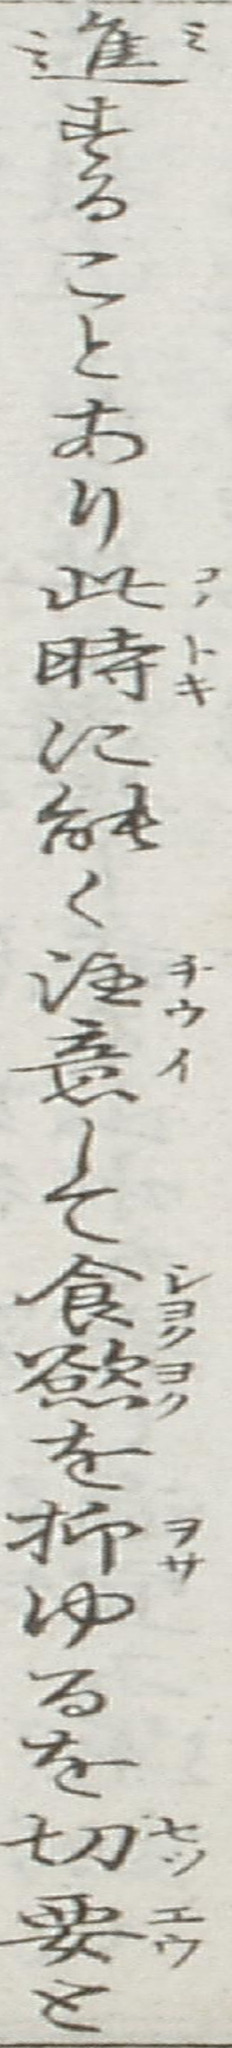進することあり此時に能く注意して食慾を抑ゆるを切要と
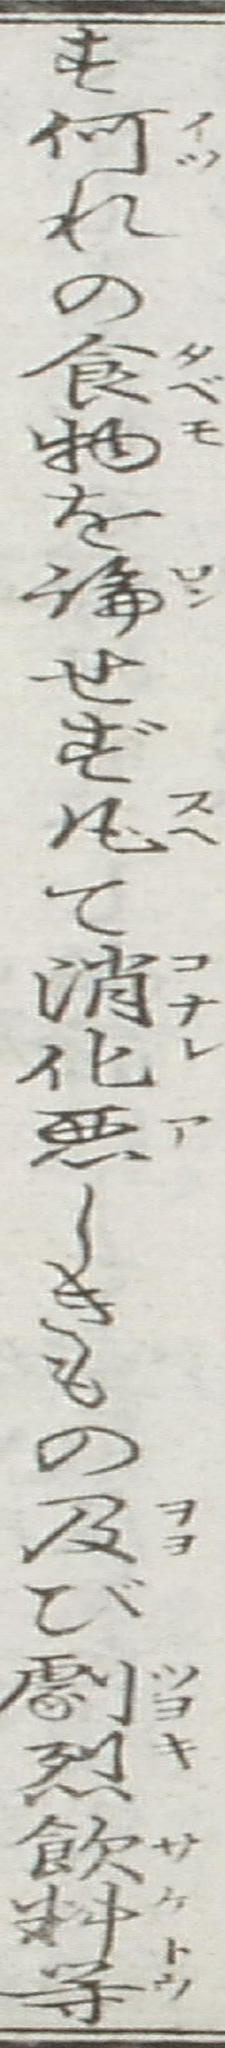す何れの食物を論せず凡て消化悪しきもの及び劇烈飲料等
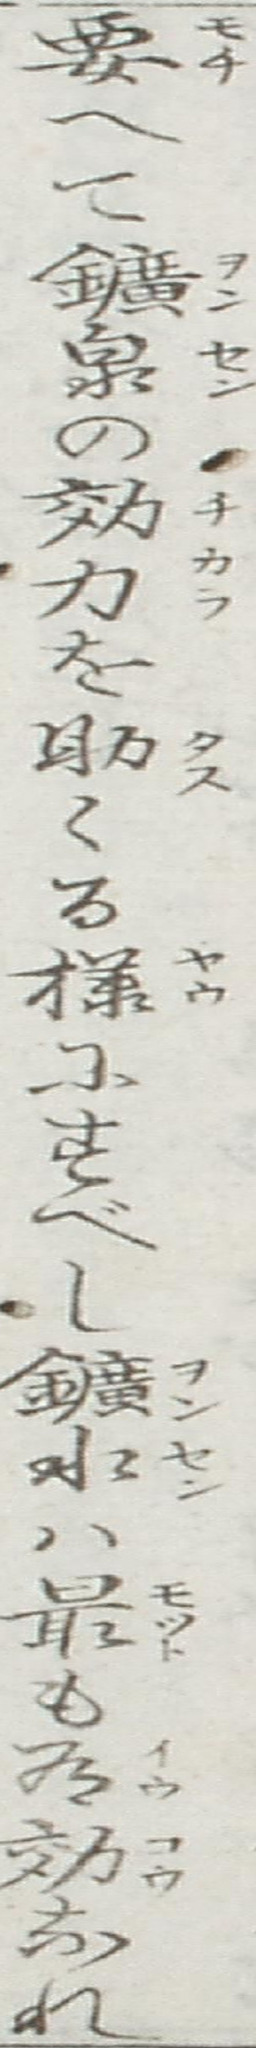要へて鉱泉の効力を助くる様にすべし鉱水は最も有効なれ
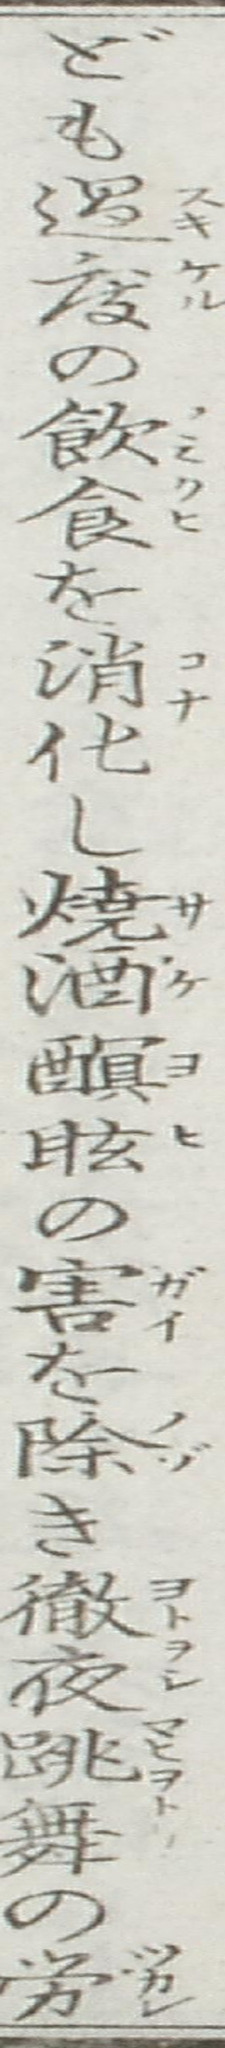ども過度の飲食を消化し焼酒？眩の害を除き徹夜跳舞の労
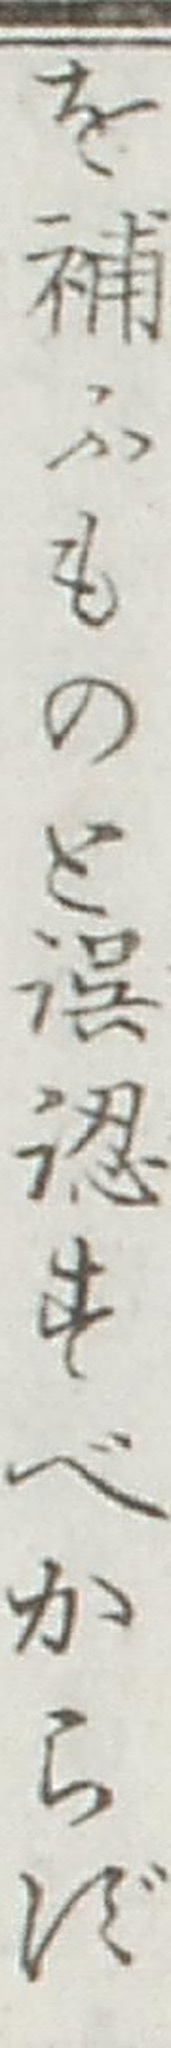を補ふものと誤認すべからず
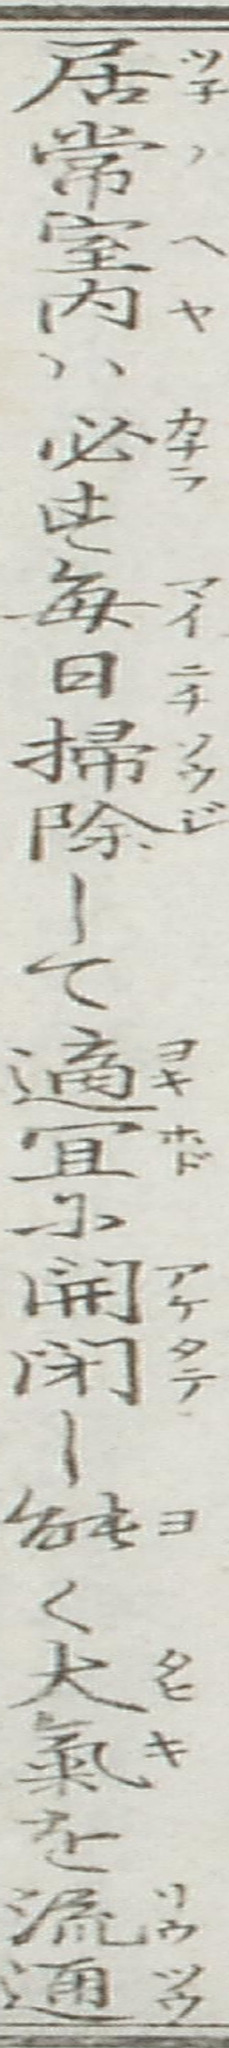居常室内は必ず毎日掃除して適宜に開閉し能く大気を流通

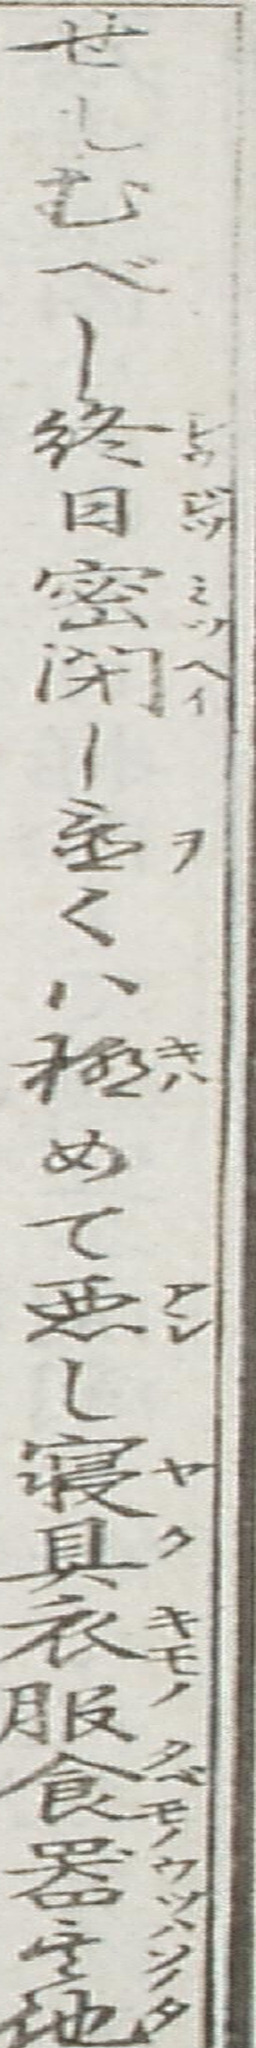せしむべし終日密閉し置くは極めて悪し寝具衣服食器其他
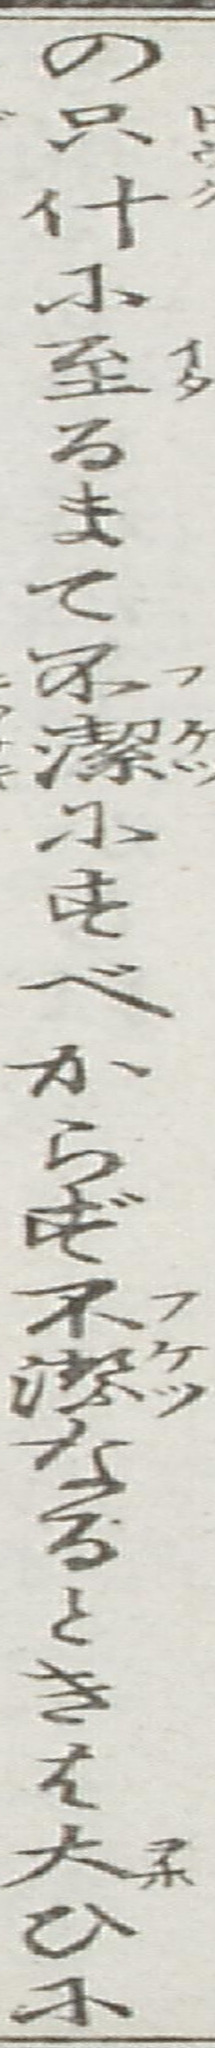の只什に至るまて不潔にすべからず不潔なるときは大ひに
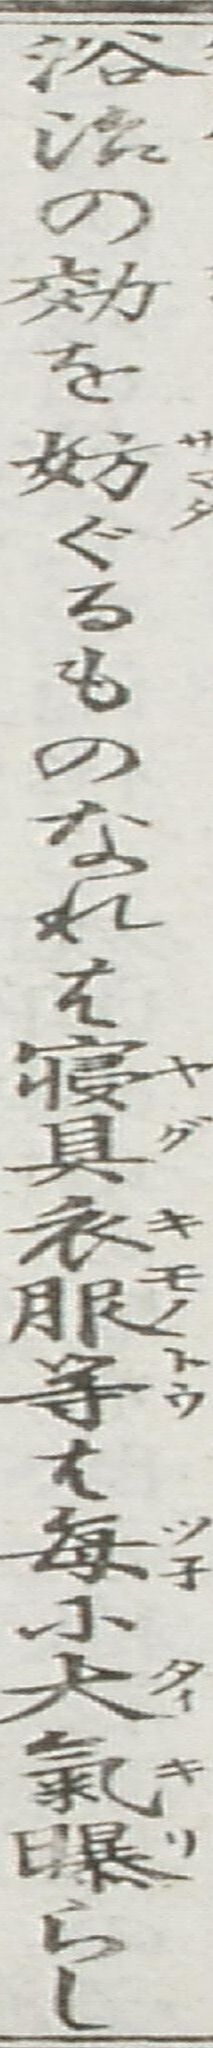浴治の効を妨ぐるものなれは寝具衣服等は毎に大気曝らし
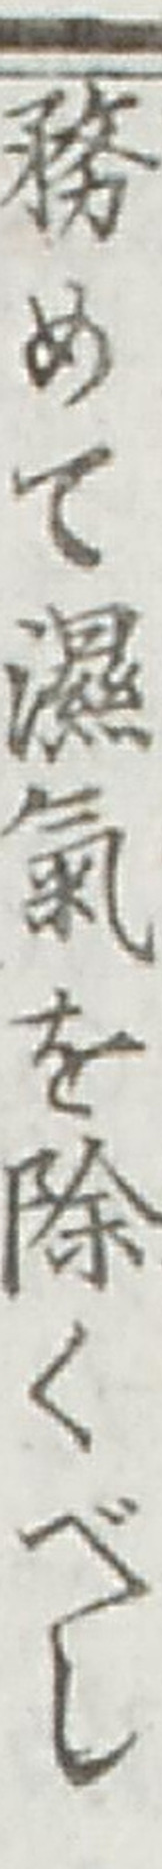務めて湿気を除くべし
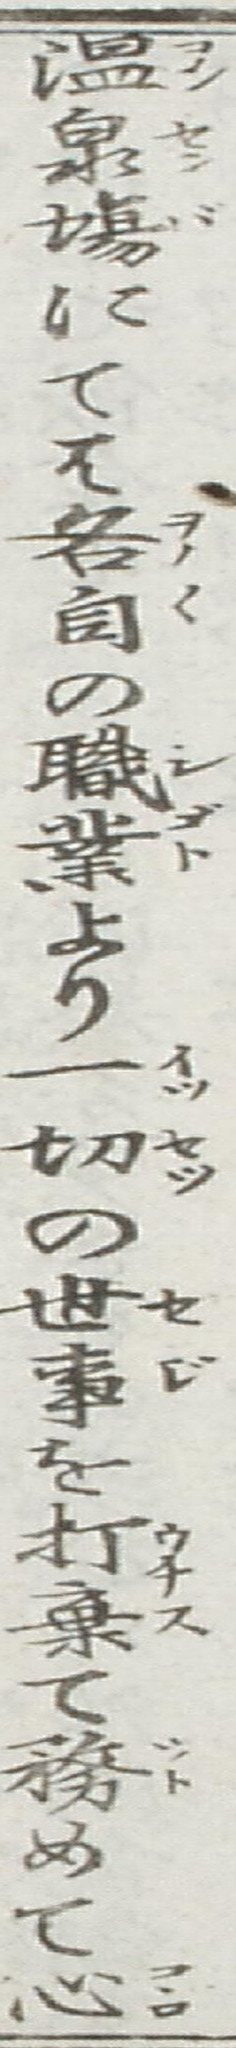温泉場にては各自の職業より一切の世事を打棄て務めて心
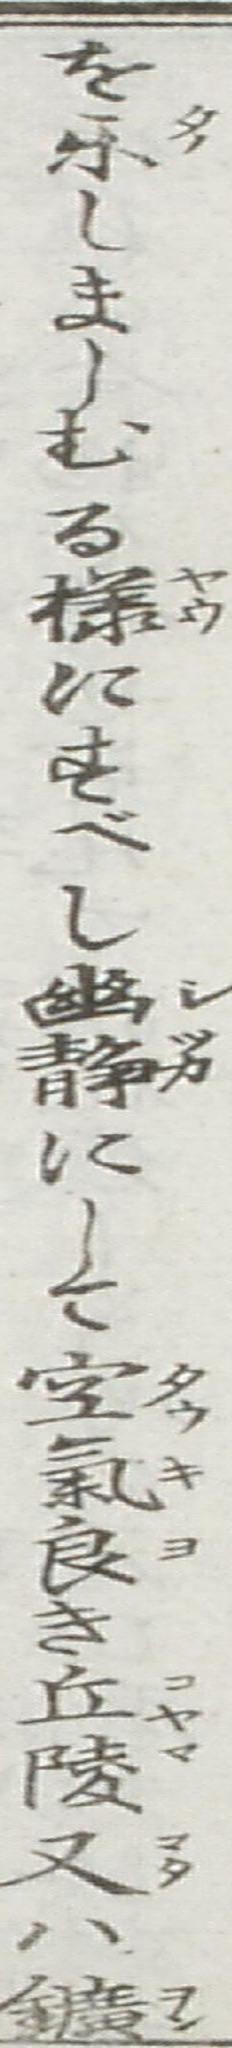を楽しましむる様にすべし幽静にして空気良き丘陵又は鉱
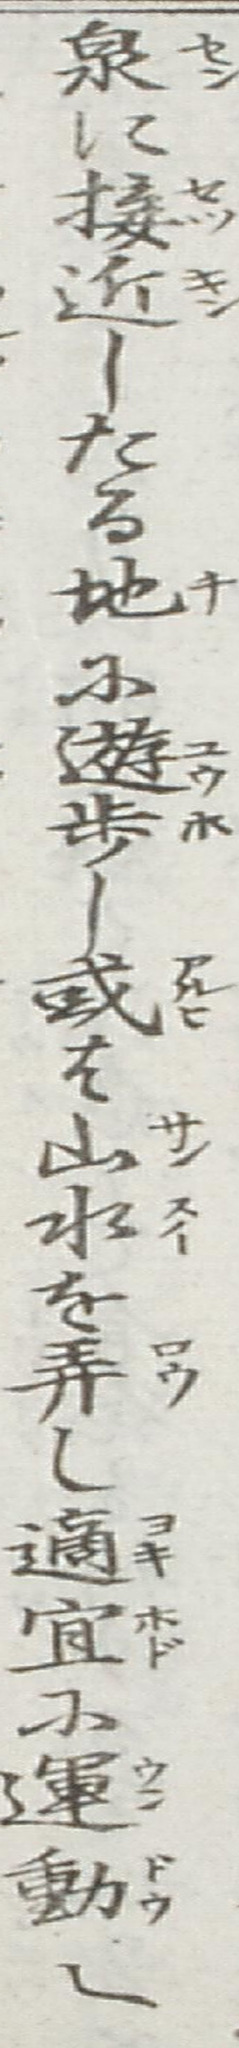泉に接近したる地に游歩し或は山水を弄し適宜に運動し
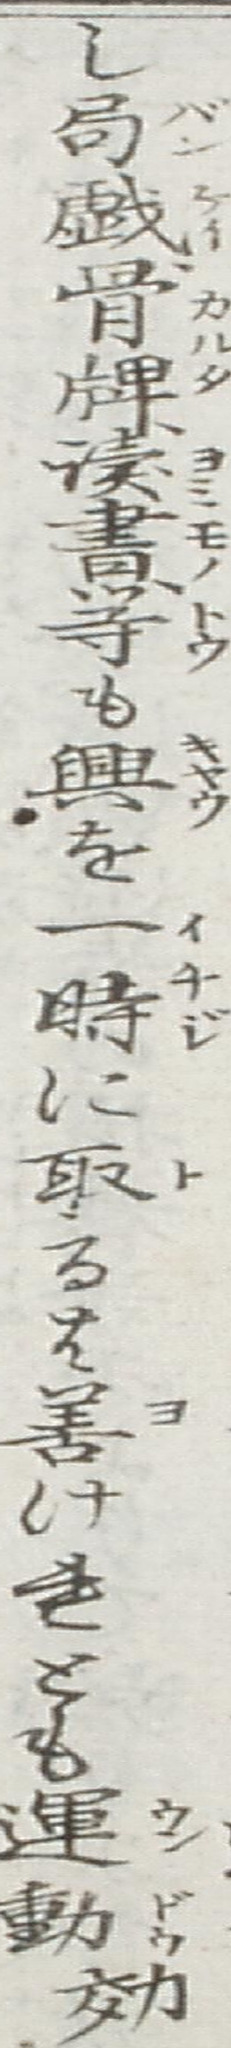し局戯骨牌読書等も興を一時に取るは善けれとも運動効
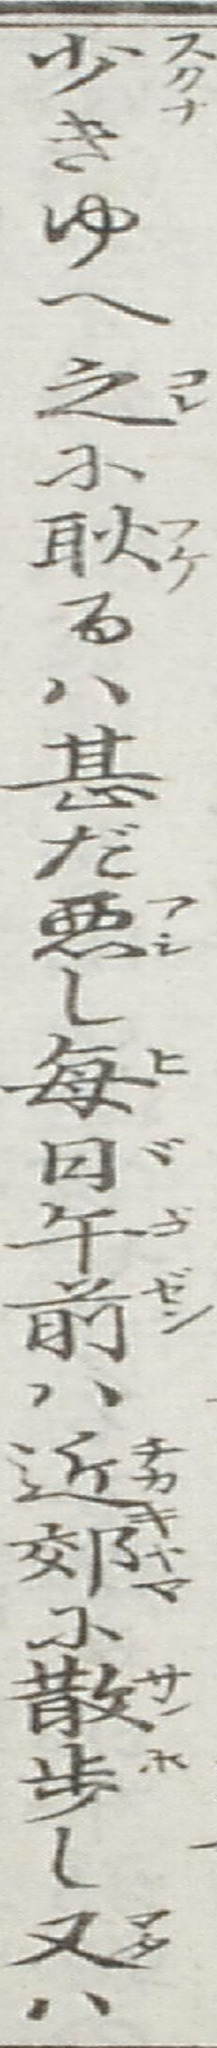少きゆへ之に耿るは甚だ悪し毎日御前は近郊に散歩し又は
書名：草津温泉誌　全
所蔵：東京大学地震研究所図書室 Earthquake Research Institute Library, The University of Tokyo, JAPAN
